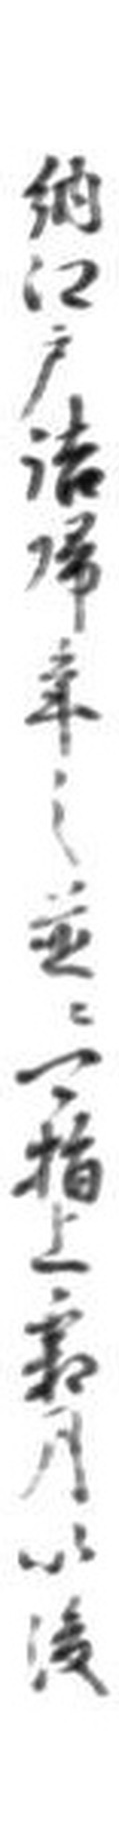納江戸詰帰年之並ニ可指上霜月以後
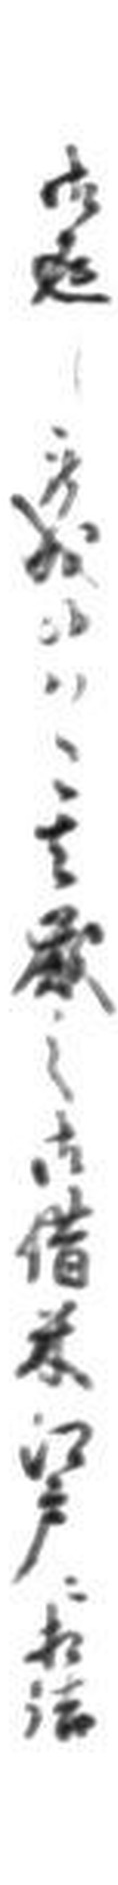御返し被成候ハヽ其歳之御借米江戸ニ相詰
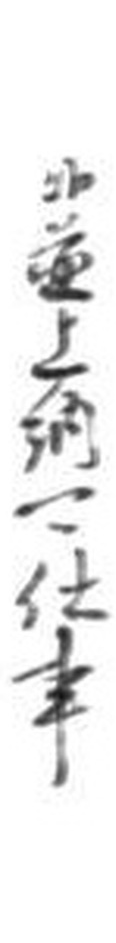候並上納可仕事
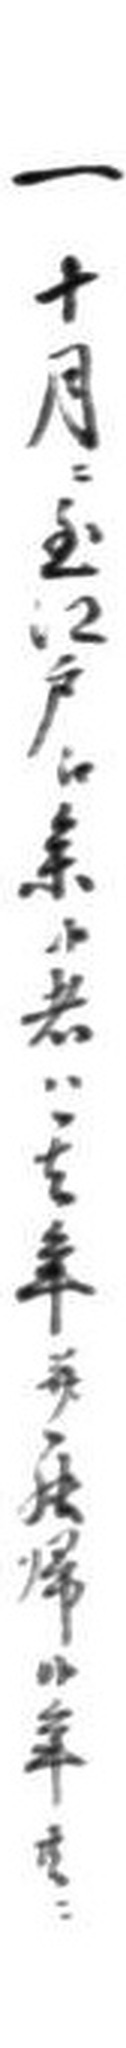一十月ニ至江戸江参候者ハ其年并罷帰候年共ニ
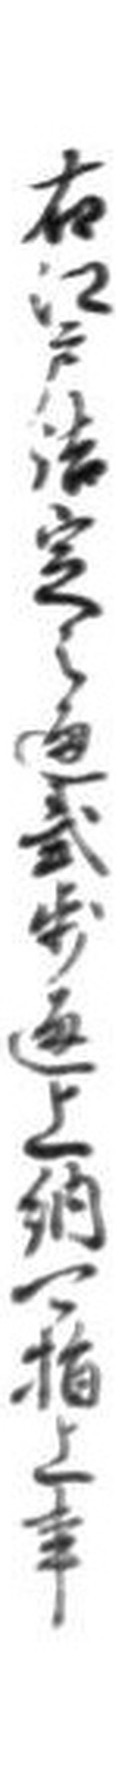右江戸詰定之通弐歩通上納可指上事

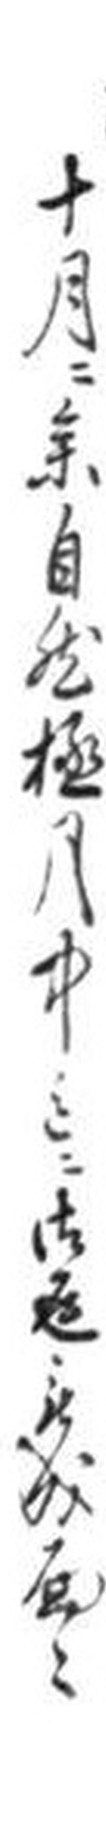十月ニ参自然極月中迄ニ御返被成面々
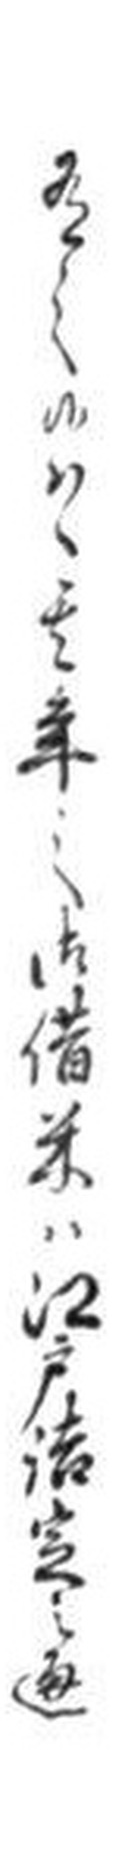有之候ハヽ其年之御借米ハ江戸詰定之通
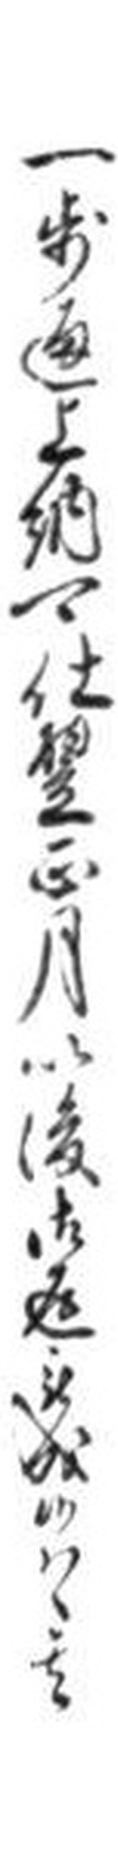一歩通上納可仕翌正月以後御返被成候ハヽ其
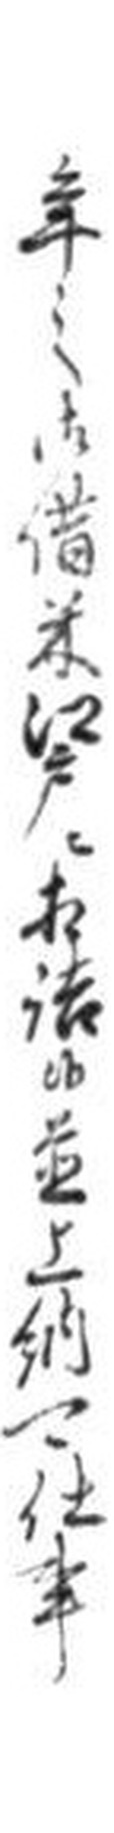年之御借米江戸ニ相詰候並上納可仕事
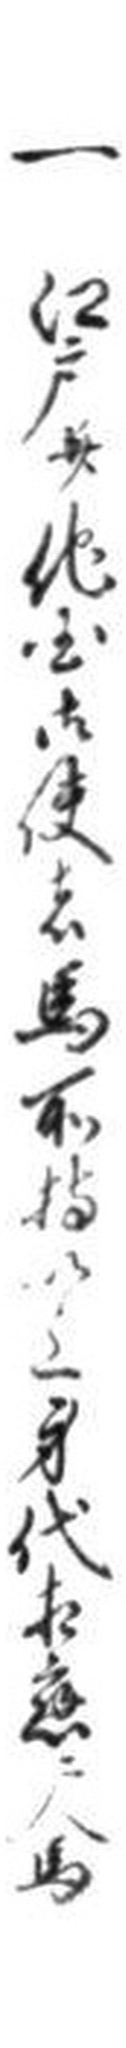一江戸并他国御使者馬所持以上身代相応ニ人馬
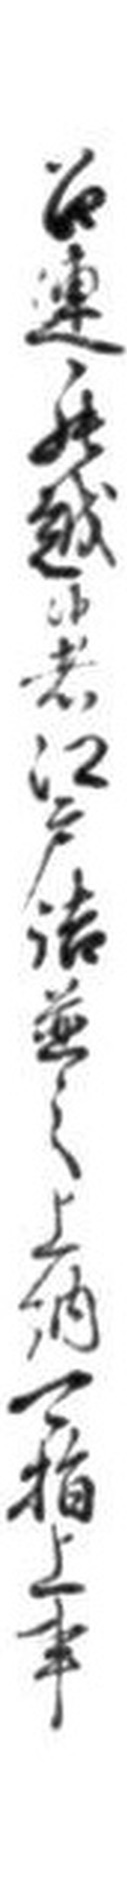召連罷越候者江戸詰並之上納可指上事
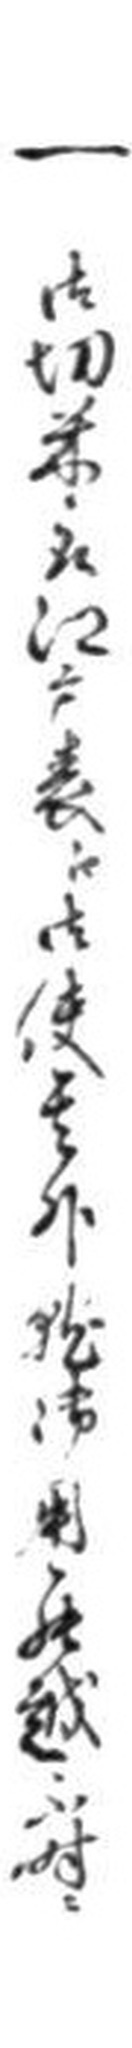一御切米取江戸表江御使其外就御用罷越不時ニ
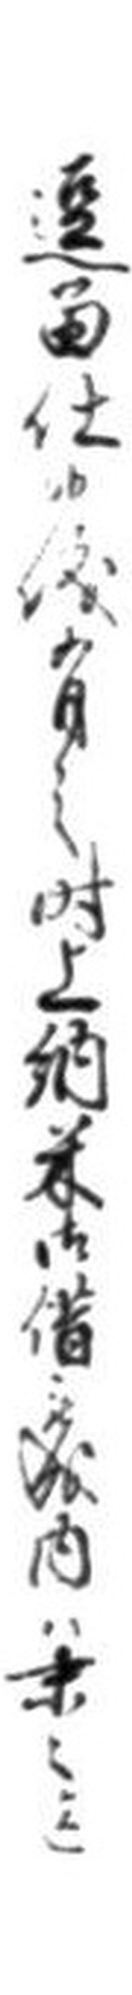逗留仕候儀有之時上納米御借被成内ハ末々迄
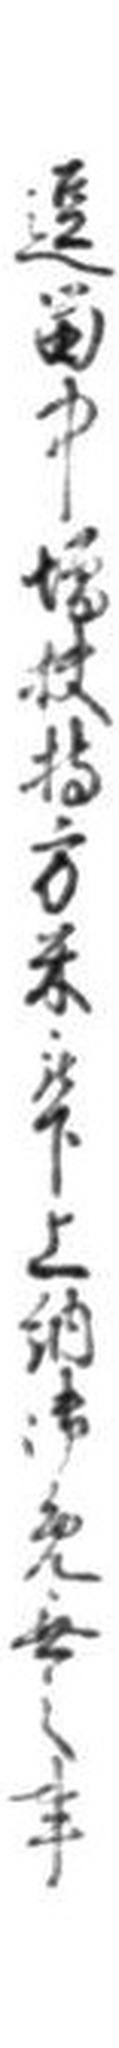逗留中増扶持方米被下上納御免無之事
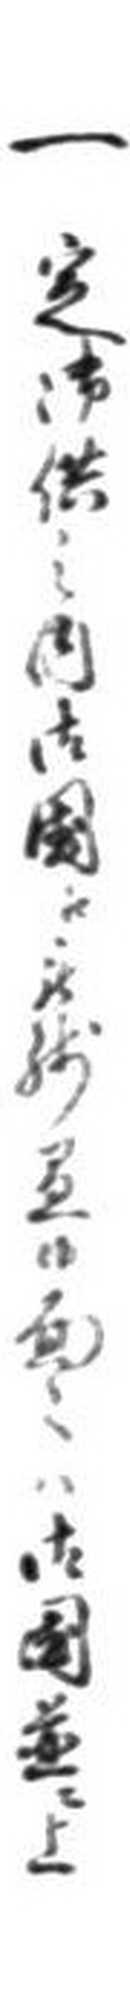一定御供之内御国江被残置候面々ハ御国並ニ上
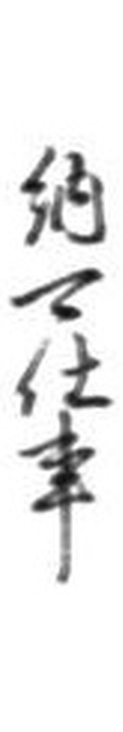納可仕事
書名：家譜 三十八 宗矩公 従享保九年五月到享保九年十二月
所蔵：福井県文書館 Fukui Prefectural Archives
